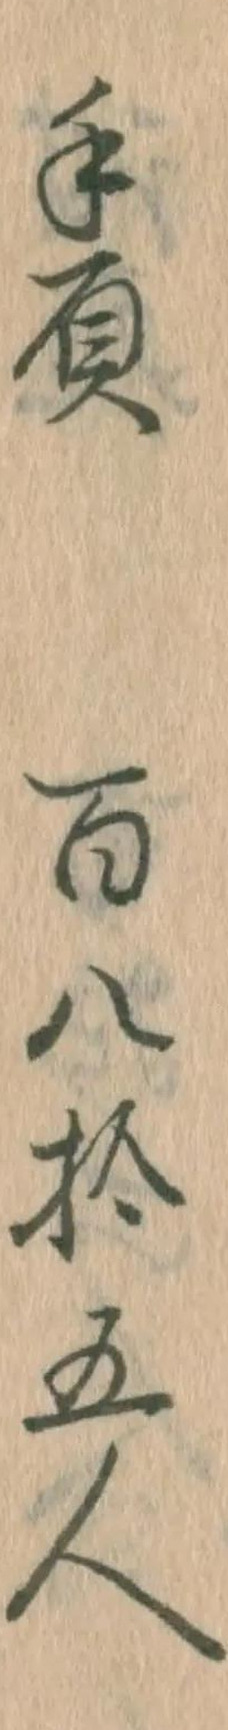手負壱百八拾五人
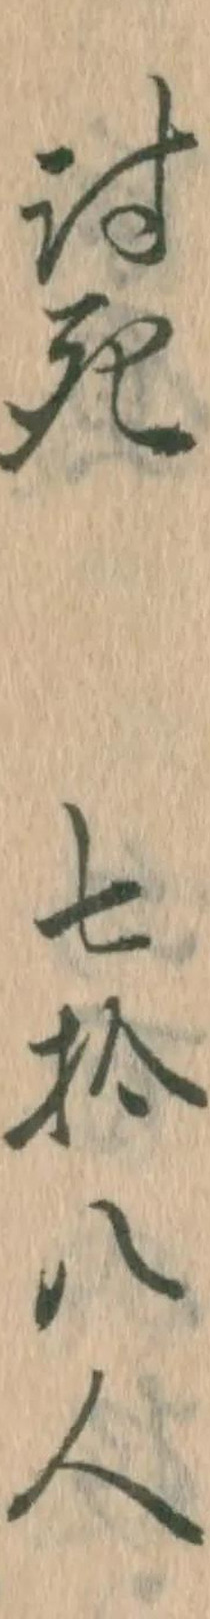討死七拾八人
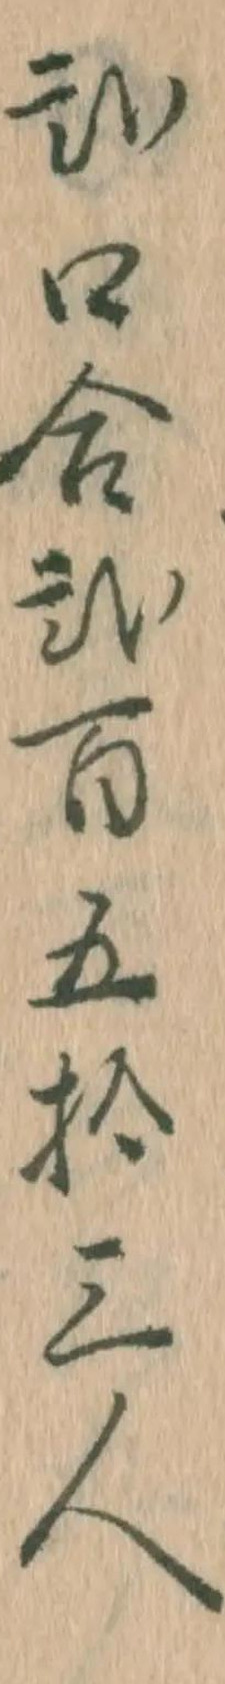弐口合弐百五拾三人
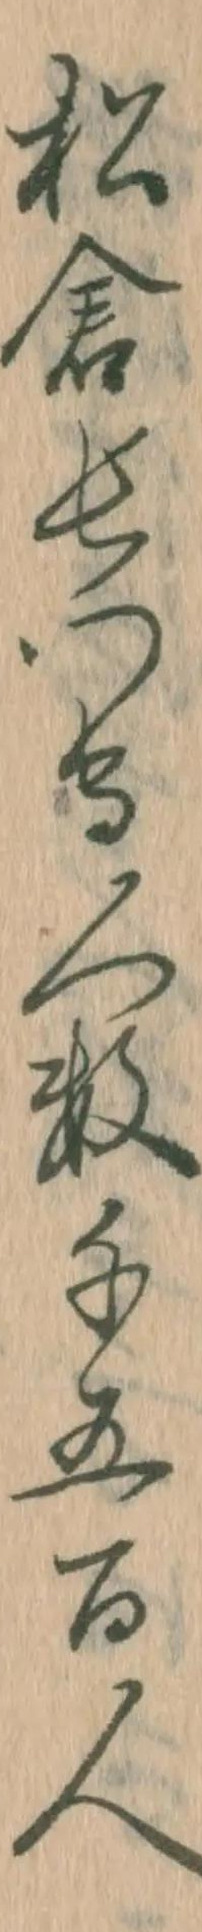松倉長門守人数千五百人
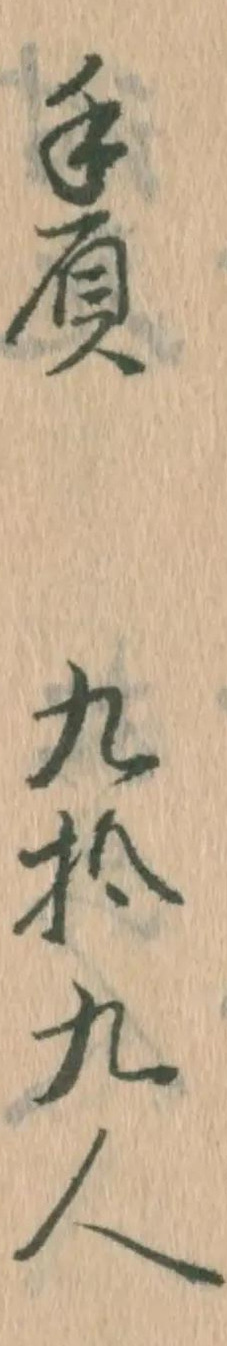手負九拾九人
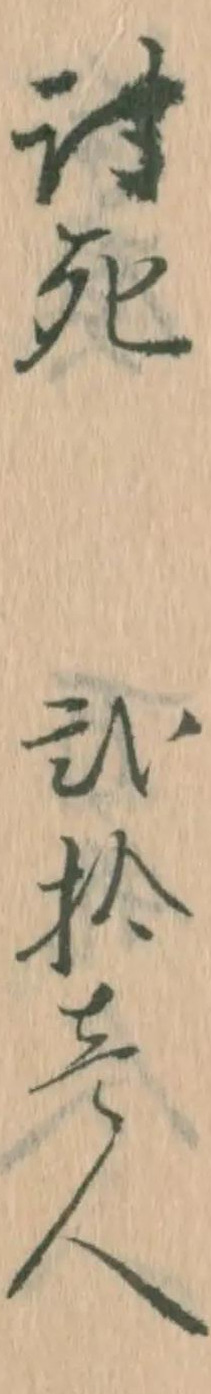討死弐拾壱人
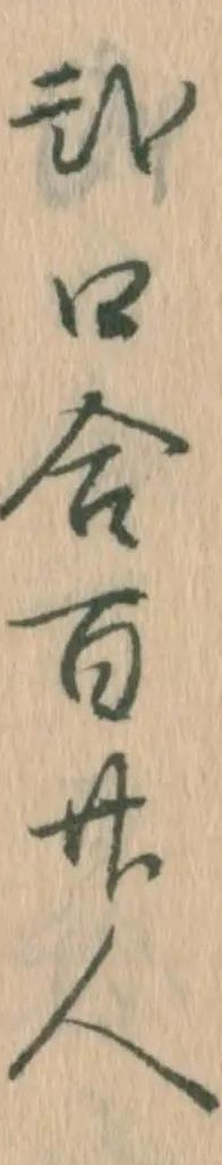弐口合百廿人
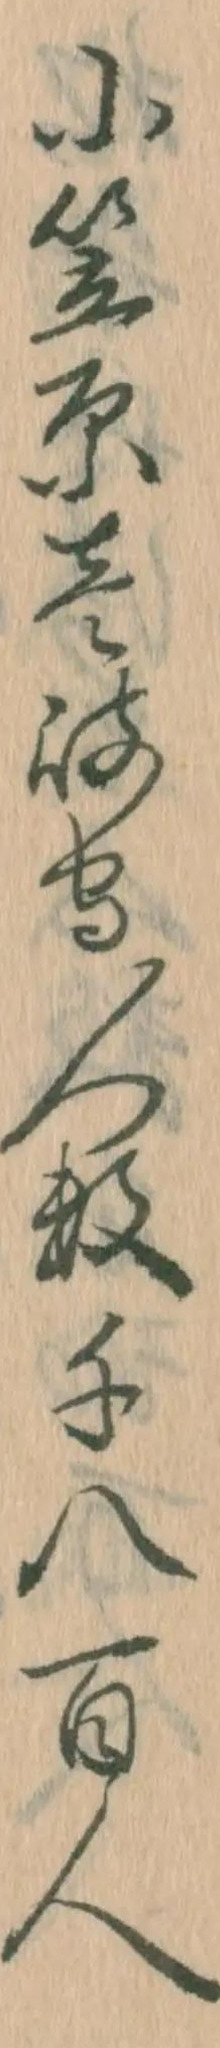小笠原壱岐守人数千八百人
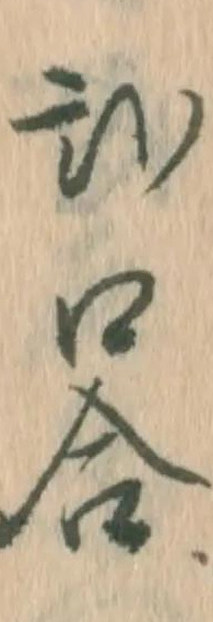弐口合
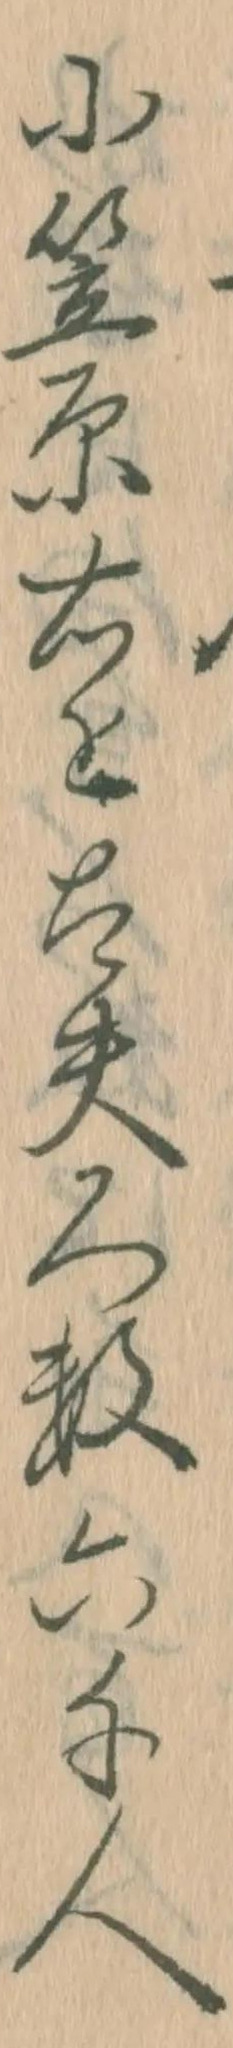小笠原右近太夫人数六千人
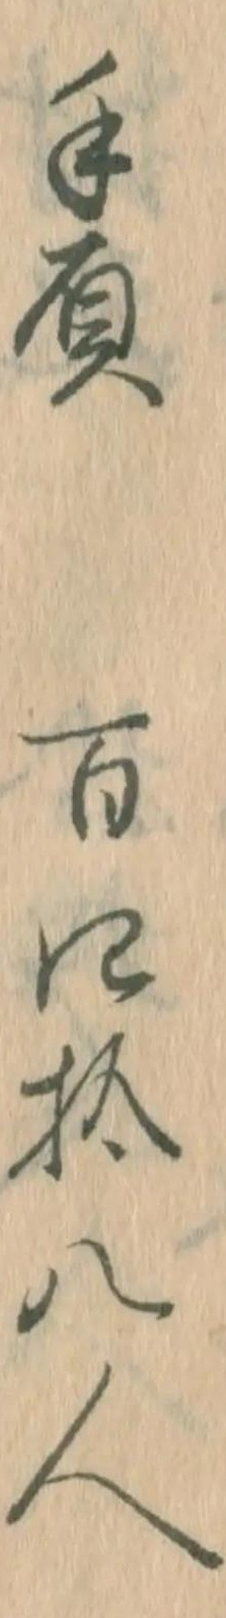手負百四拾八人

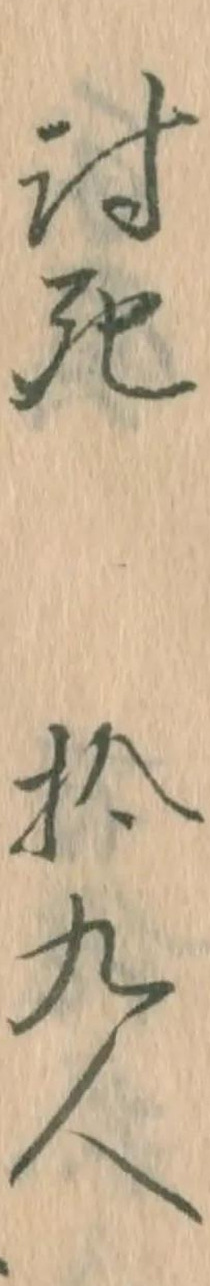討死拾九人
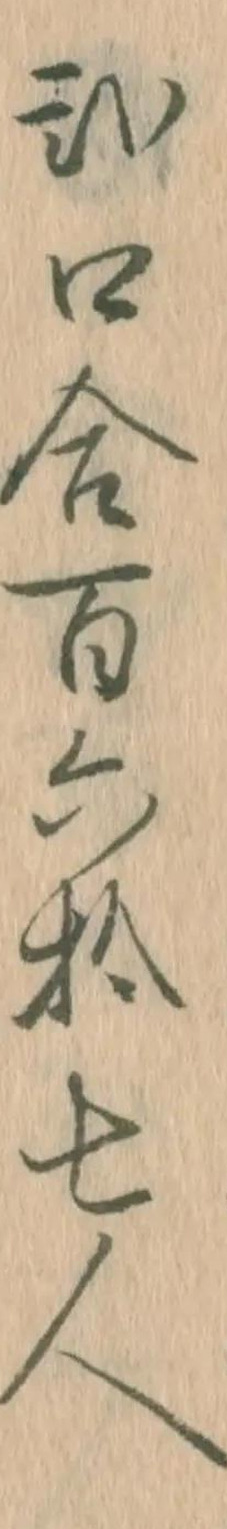弐口合百六拾七人
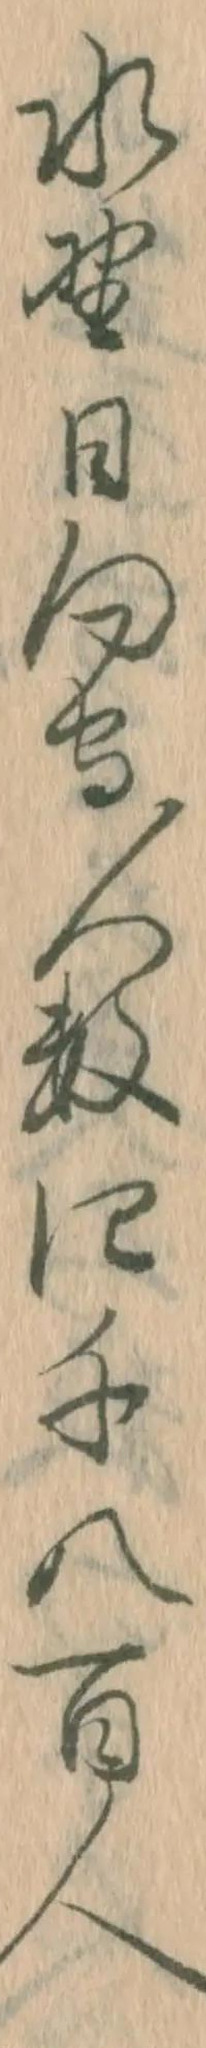水野日向守人数四千八百人
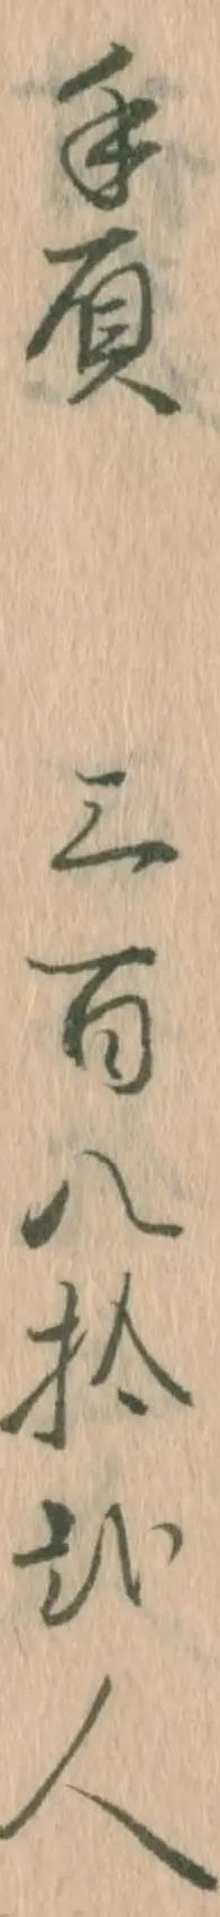手負三百八拾弐人
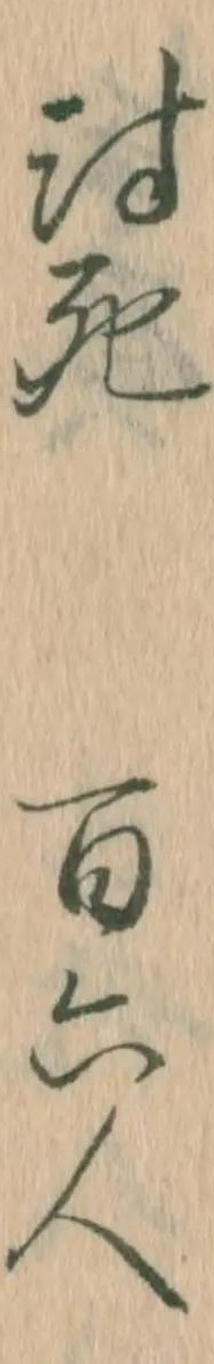討死百六人
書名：切支丹御退治記 49巻. [9]
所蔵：国立国会図書館 National Diet Library, JAPAN
